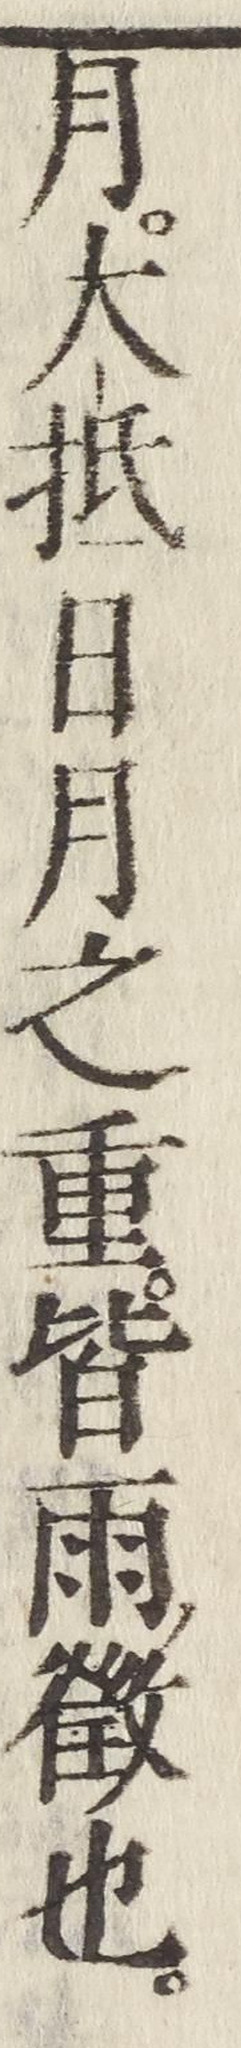月。大-抵日月之重。皆雨徴也。
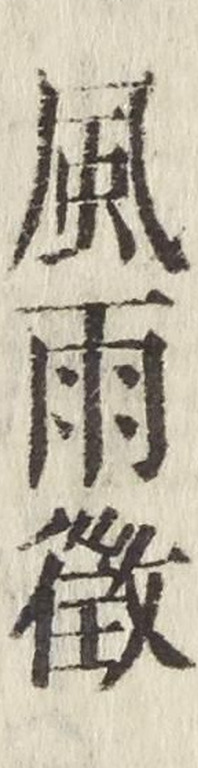風雨徴

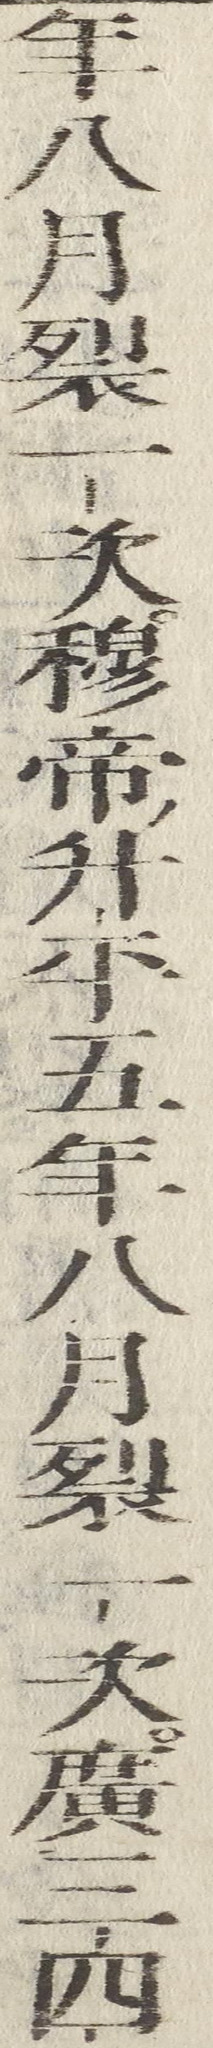年八月裂一-次。穆帝升-平五年八月裂一-次。広三-四-

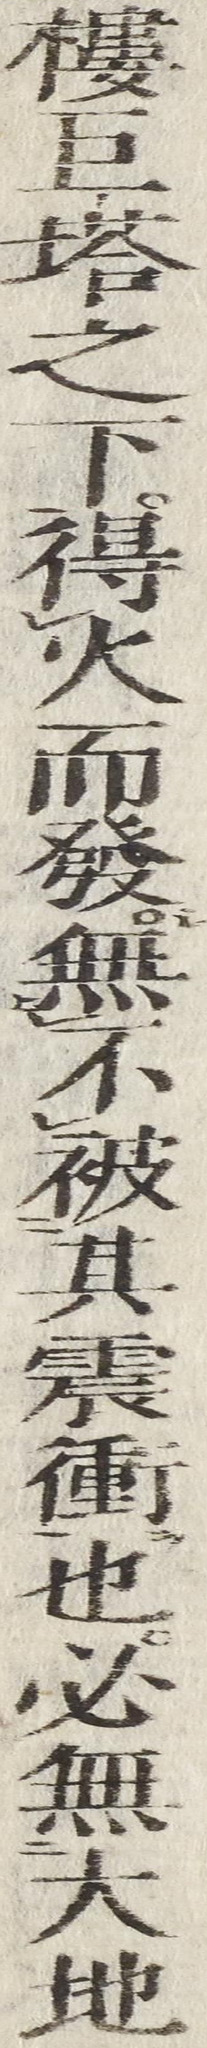楼巨-塔之下。得火而発。無レ不被其震衝也。必無大地

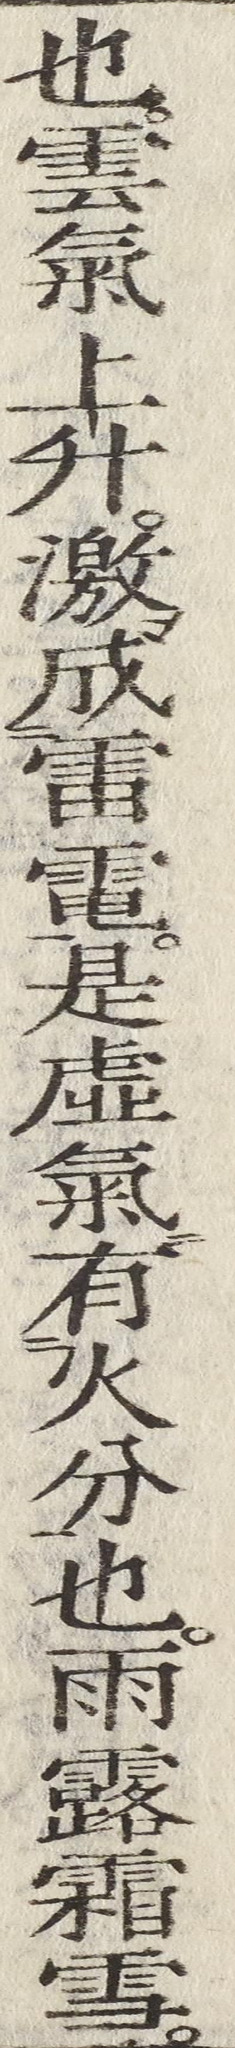也。雲気上-升。激成雷電。是虚気有火分也。雨露霜雪。
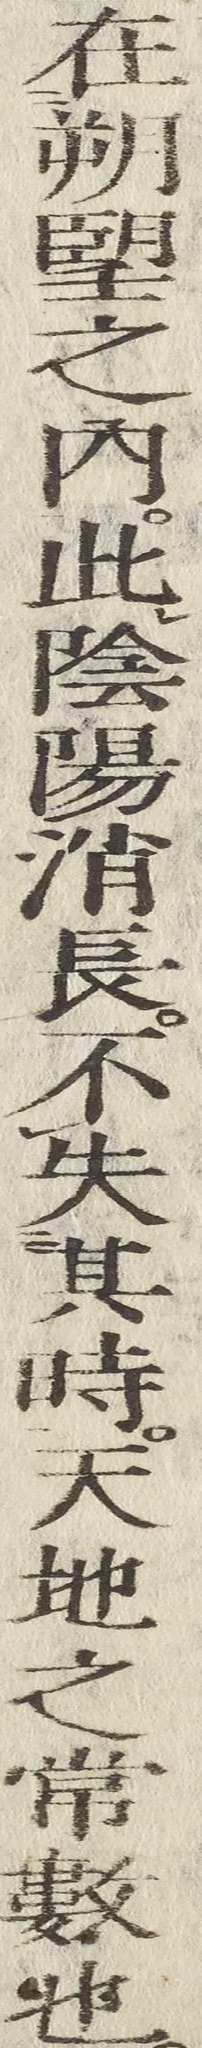在朔望之内。此陰陽消長。不失其時。天地之常数也。

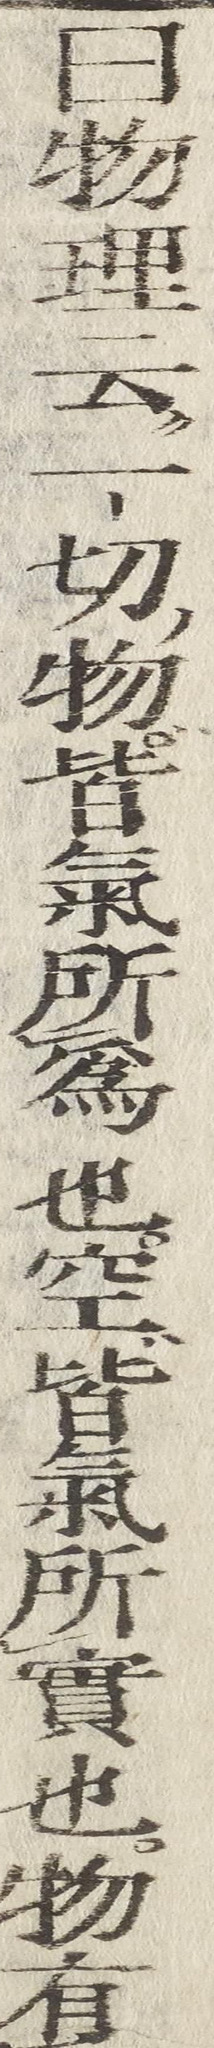曰物理云一-切物。皆気所為也。空皆気所実也。物有
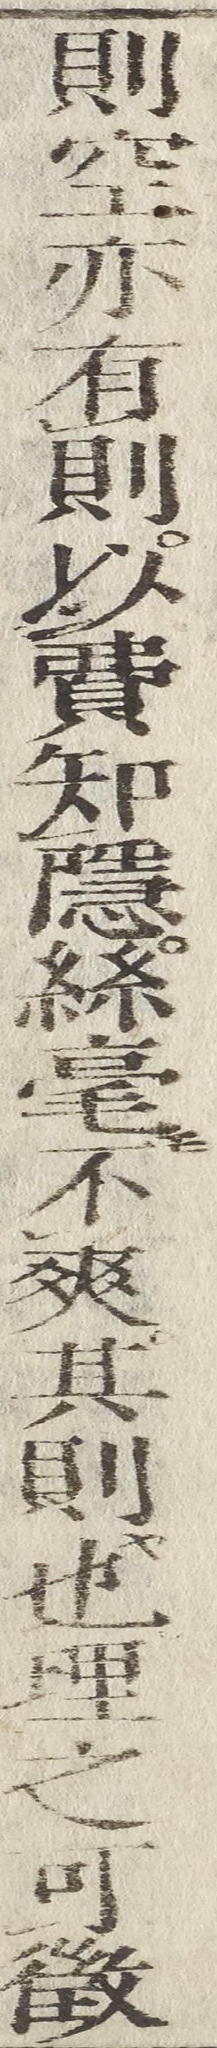則空亦有則。以費知隠。糸毫不爽。其則也。理之可徴
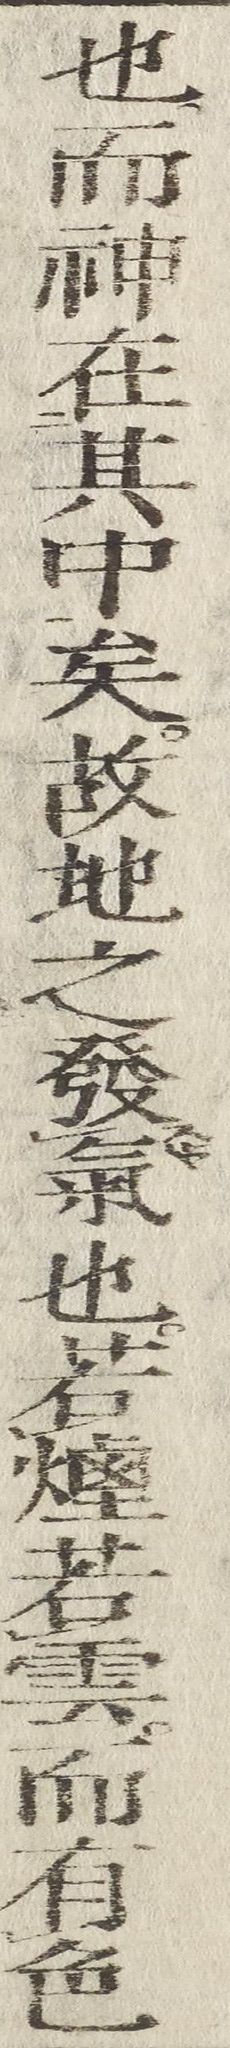也。而神在其中矣。故地之発気也。若煙若雲。而有色

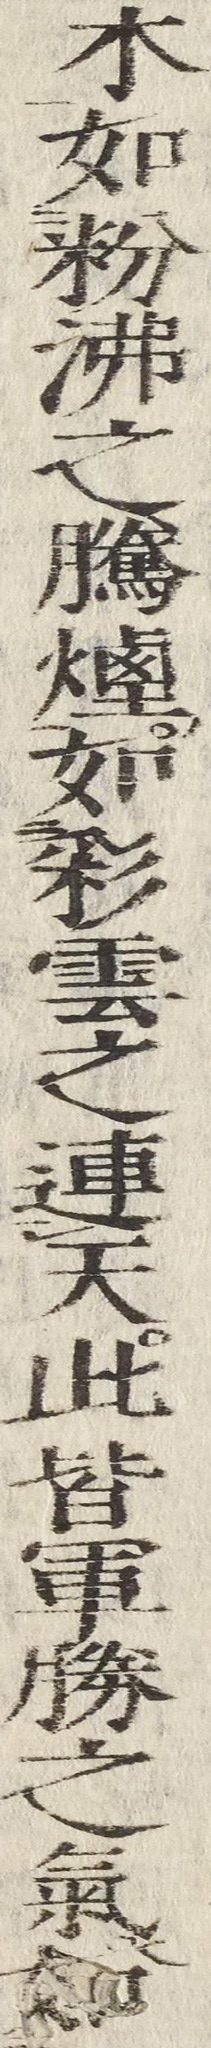木如粉沸之騰煙。如彩雲之連レ天。此皆軍勝之気。如

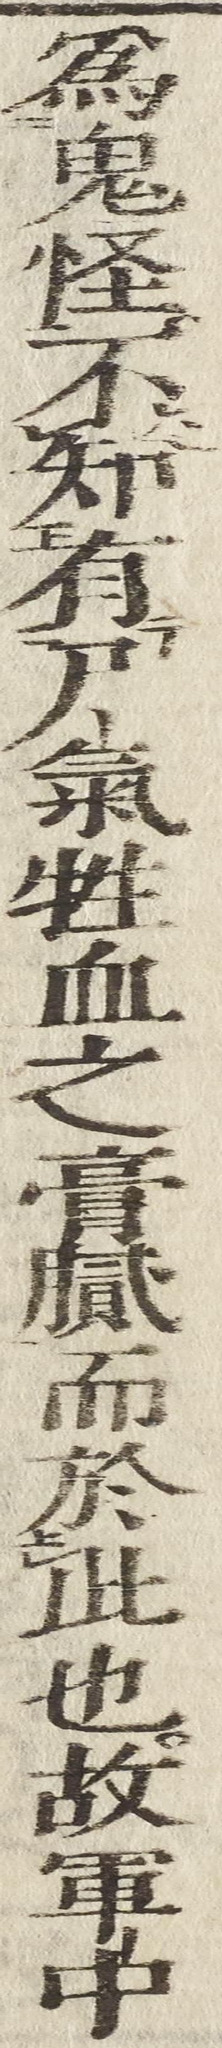為鬼怪。不也知有尸－気牲血之膏膩而於レ此也。故軍－中

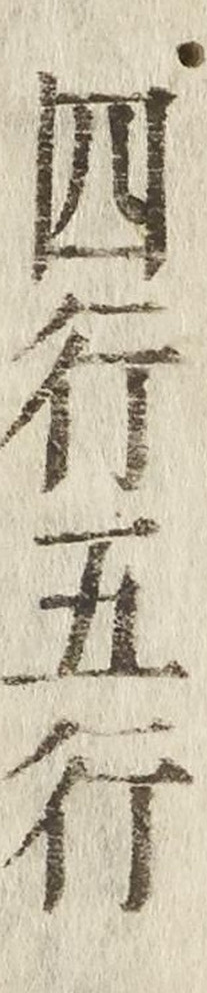四行五行
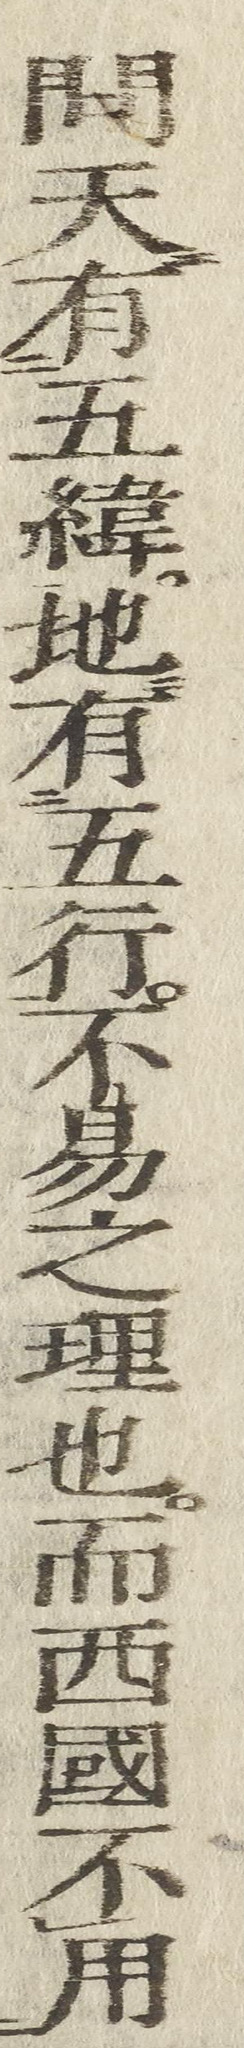問天有五緯。地有五行。不－易之理也。而西国不用

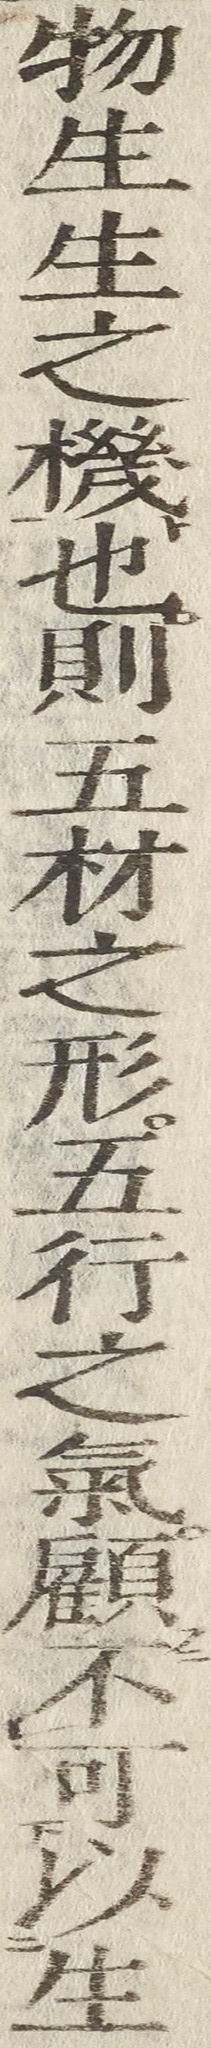物生生之機也。則五材之形。五行之気。顧不可以生

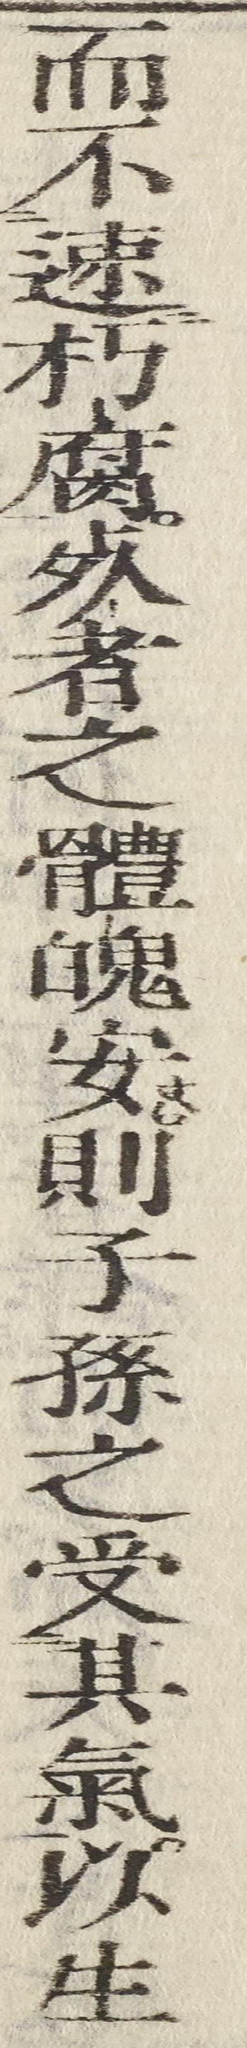而不速朽腐。死ー者之体ー魄安時ハ。則子孫之受其気。以生

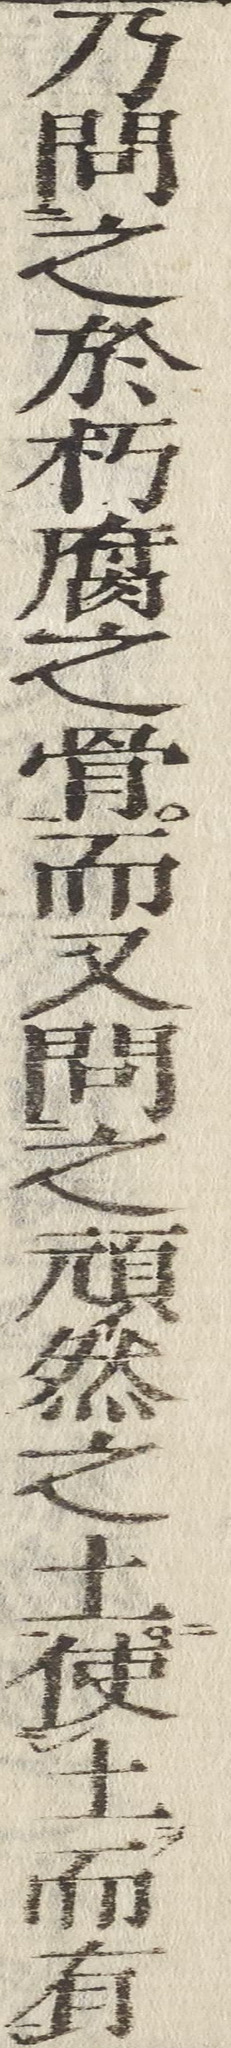乃問之於朽腐之骨。而又問之頑ー然之土。使レ土而有レ
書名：天經或問　地
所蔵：東京大学地震研究所図書室 Earthquake Research Institute Library, The University of Tokyo, JAPAN
